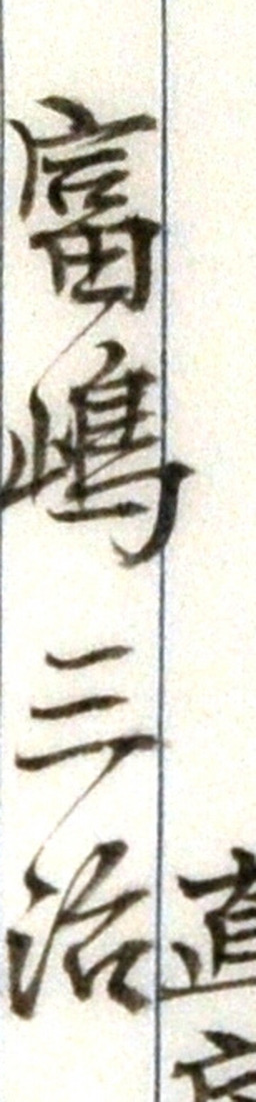富嶋三治

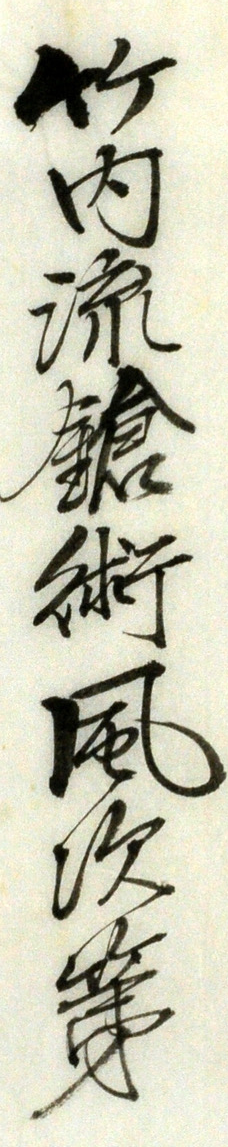竹内流鎗術風次第
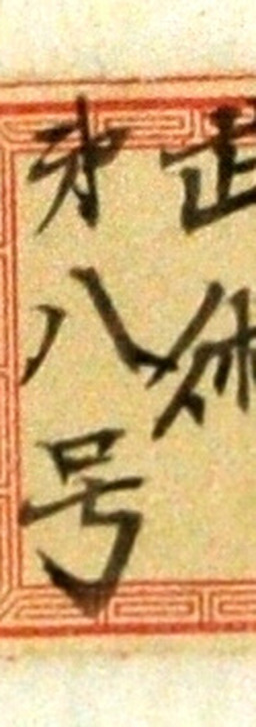第八号

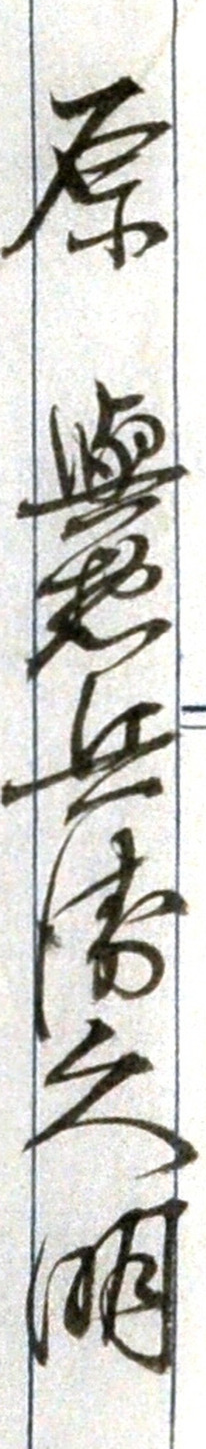原与惣兵衛久明
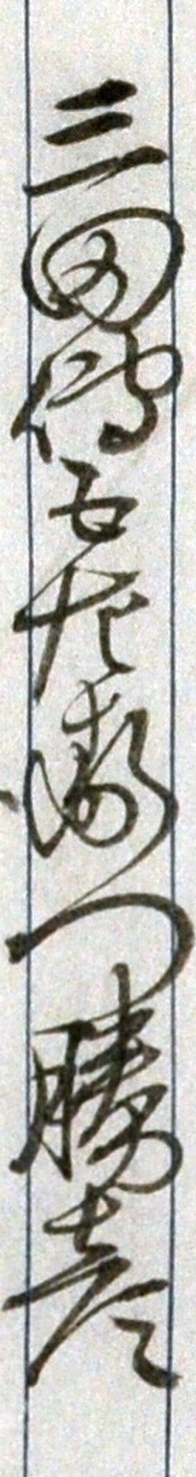三田伝五左衛門勝彦
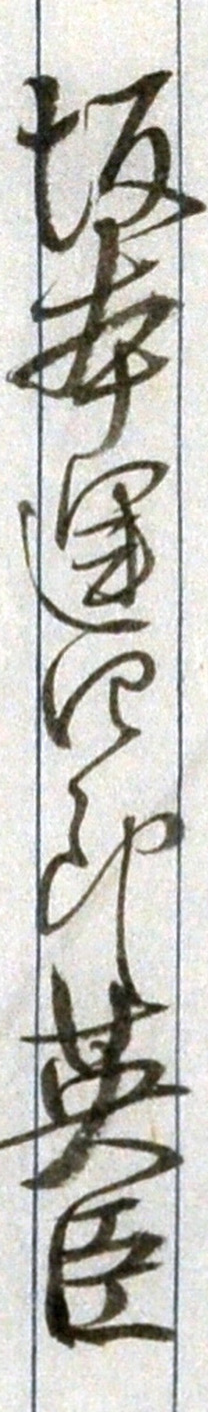坂本運四郎英臣
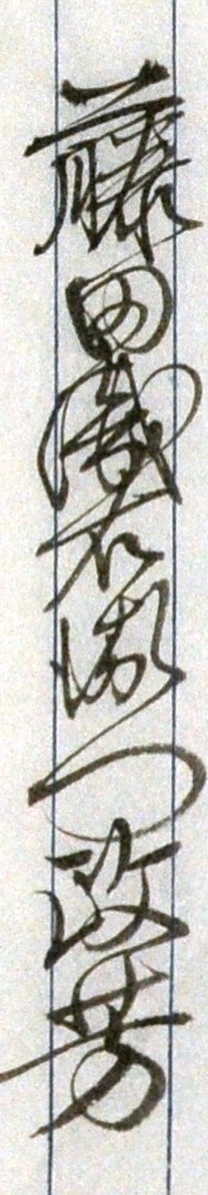藤田織右衛門政芳
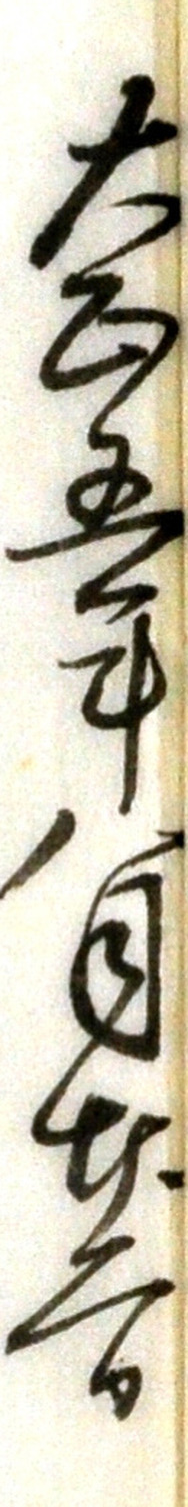大正五年八月廿ニ日
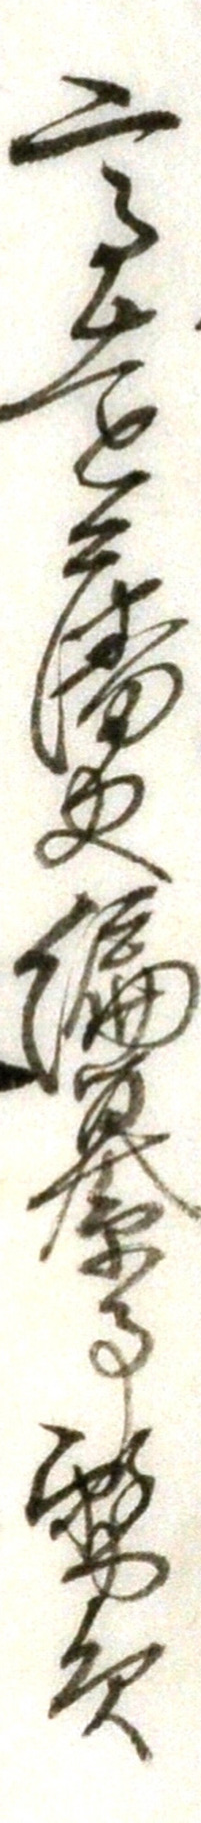高遠藩史編纂事務員
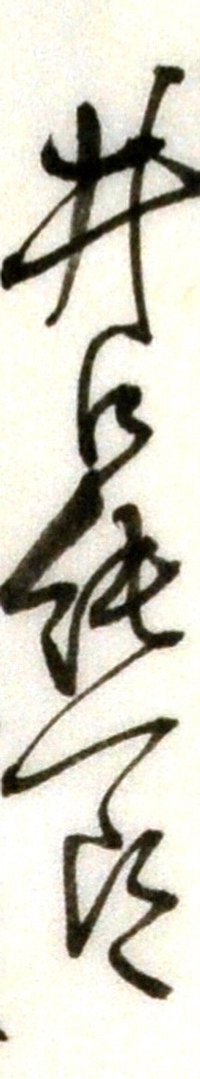井口純一郎

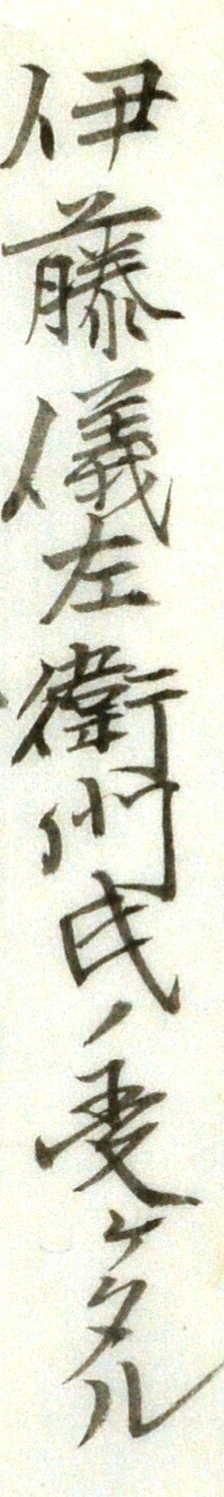伊藤儀左衛門氏ノ受ケタル
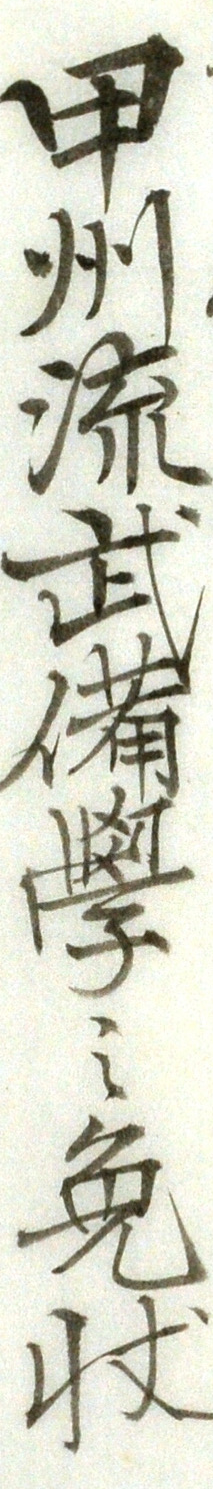甲州流武備学之免状
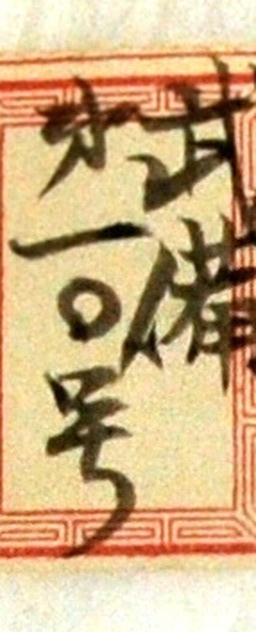第一〇号

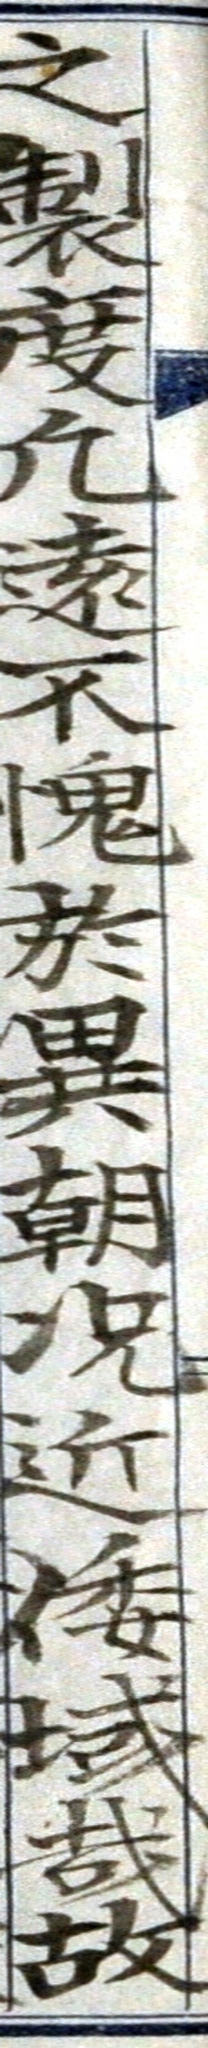之製度凢遠不愧於異朝况近倭域哉故
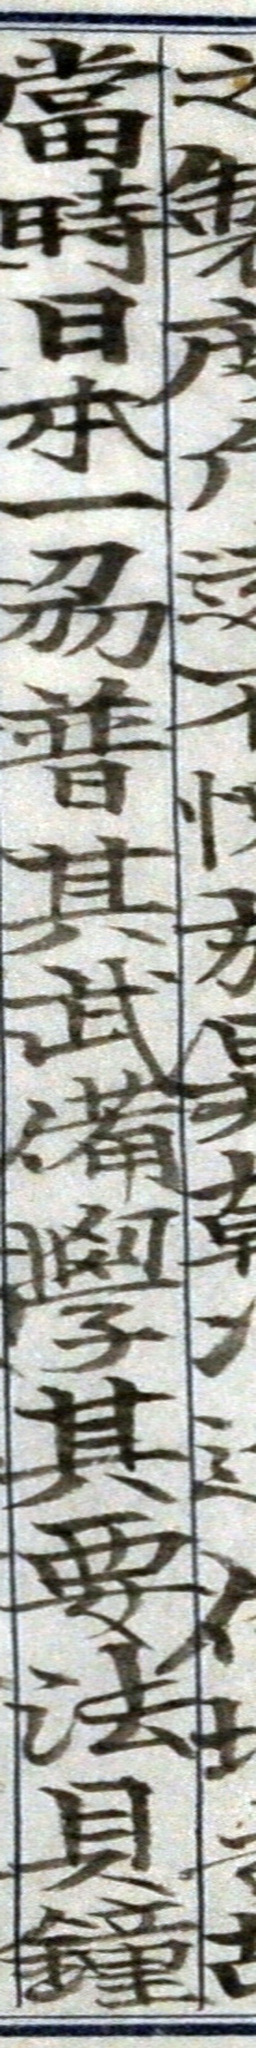當時日本一州普其武備学其要法貝鐘
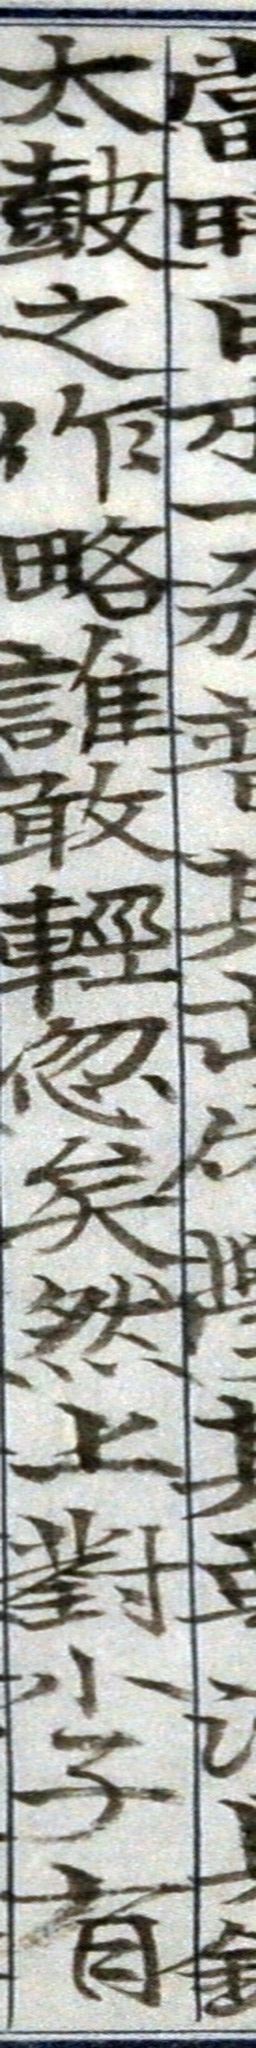太皷之作略誰敢軽忽矣然上対小子有
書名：竹内流・甲州流・荒木流・一刀流新当流起請文及免許写堤宝山流手鏡及個之大事
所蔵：伊那市立高遠町図書館・合同会社AMANE
